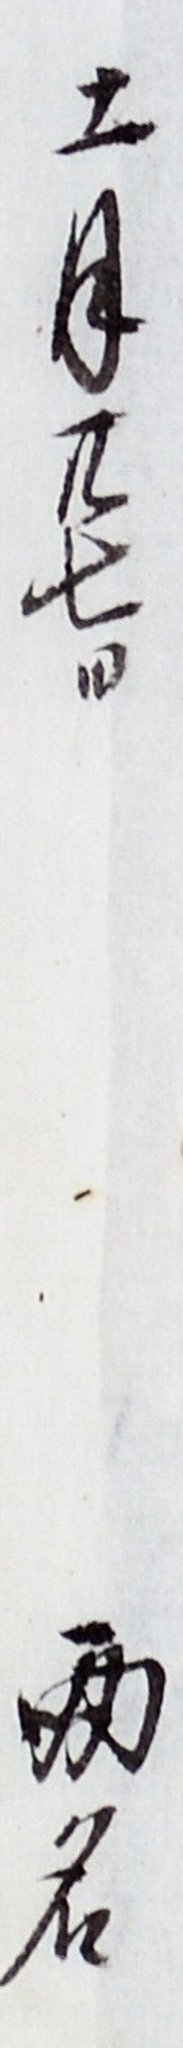十一月廿七日両名
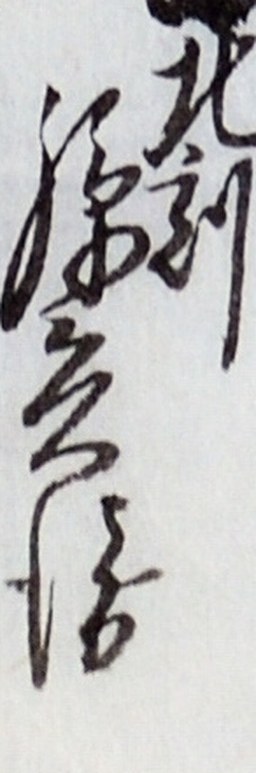孫兵衛
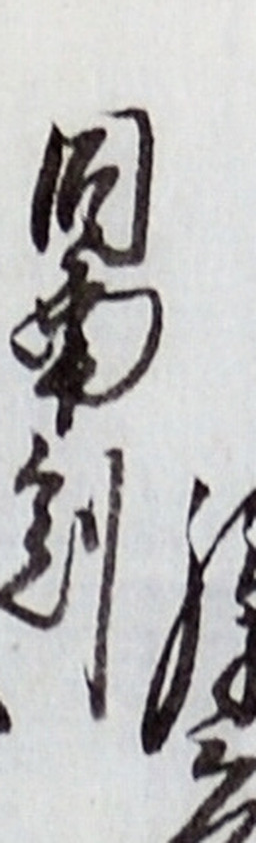同南割
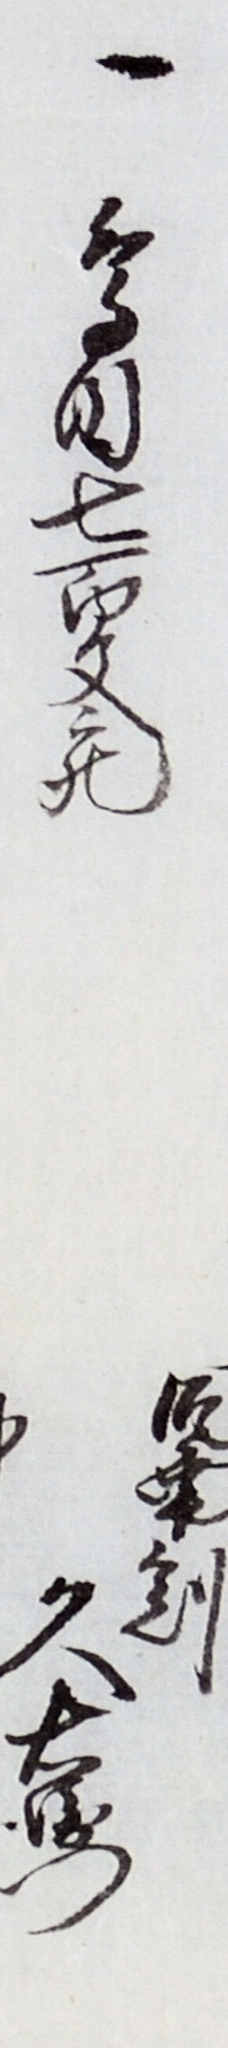一鳥目七百文宛久右衛門
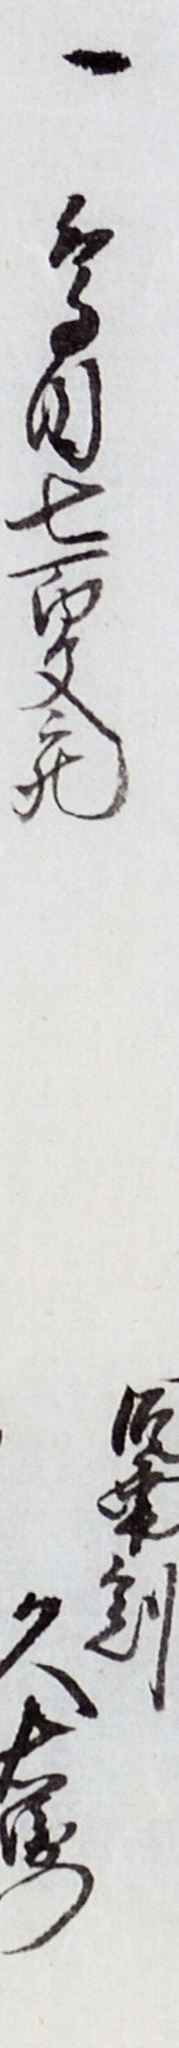一鳥目七百文宛久右衛門
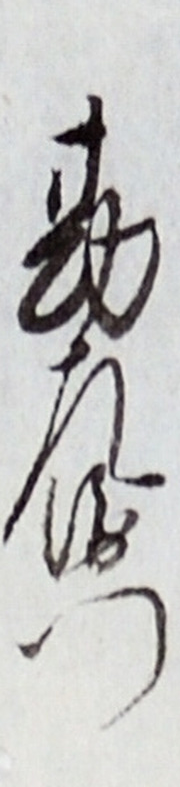勘左衛門
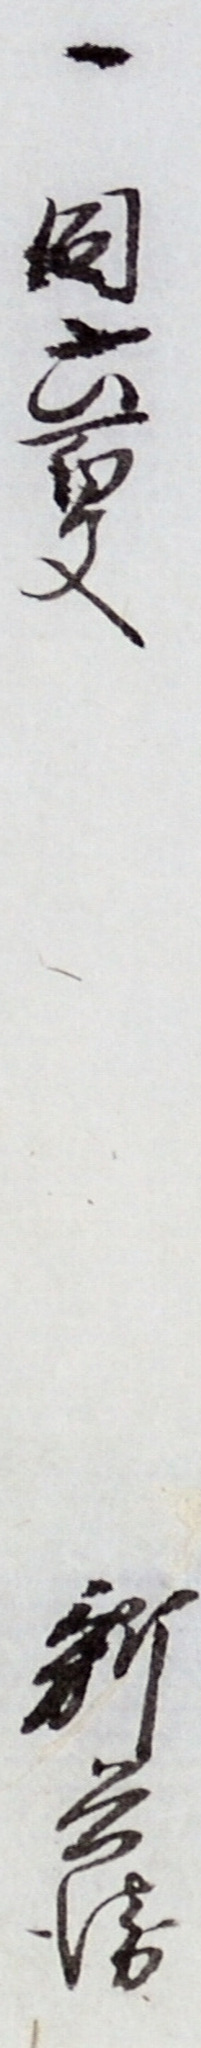一同六百文新兵衛
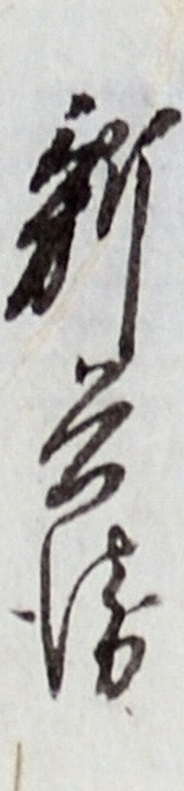孫兵衛
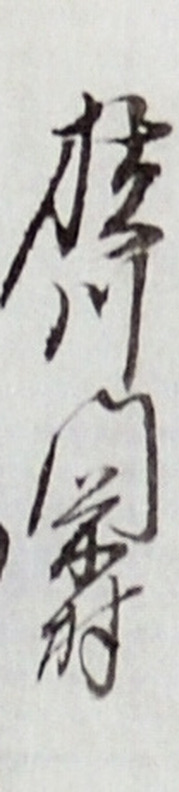横川門前村
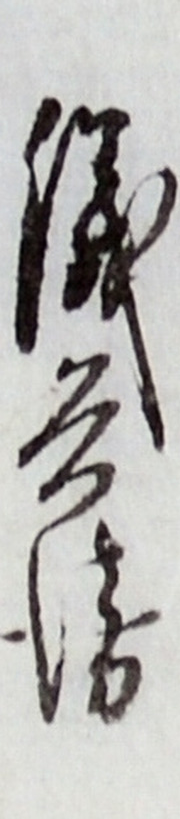儀兵衛
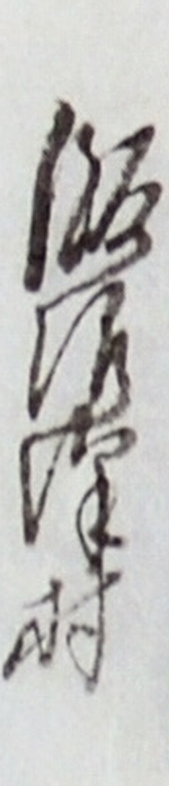飯沼澤村
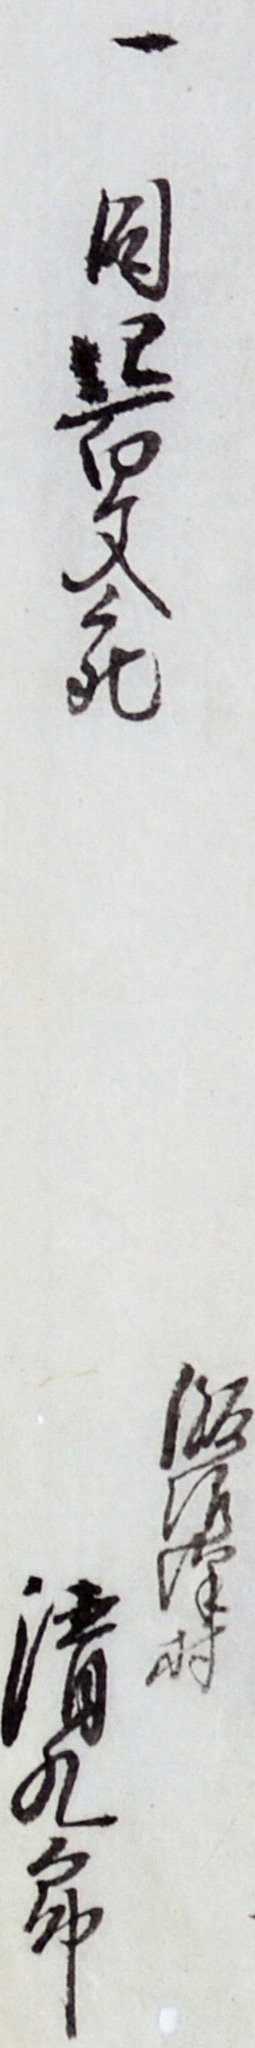一同四百文宛清九郎

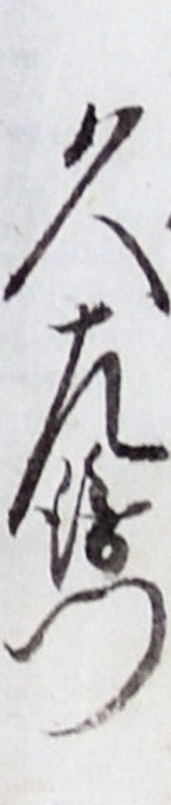久左衛門
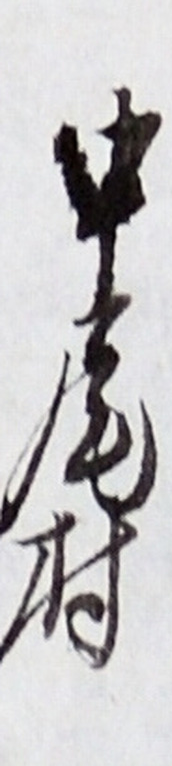中尾村
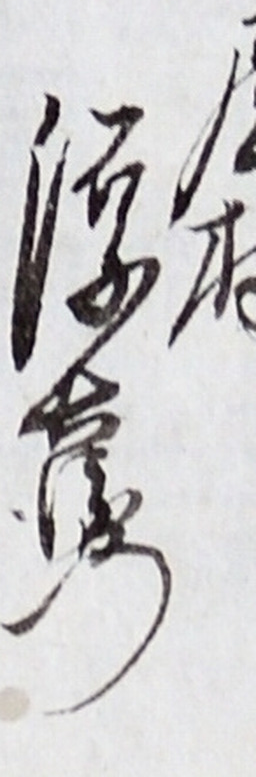源右衛門
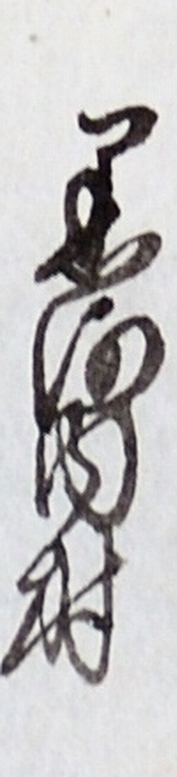黒河内村
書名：御山奉行御用控
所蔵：伊那市立高遠町図書館・合同会社AMANE
